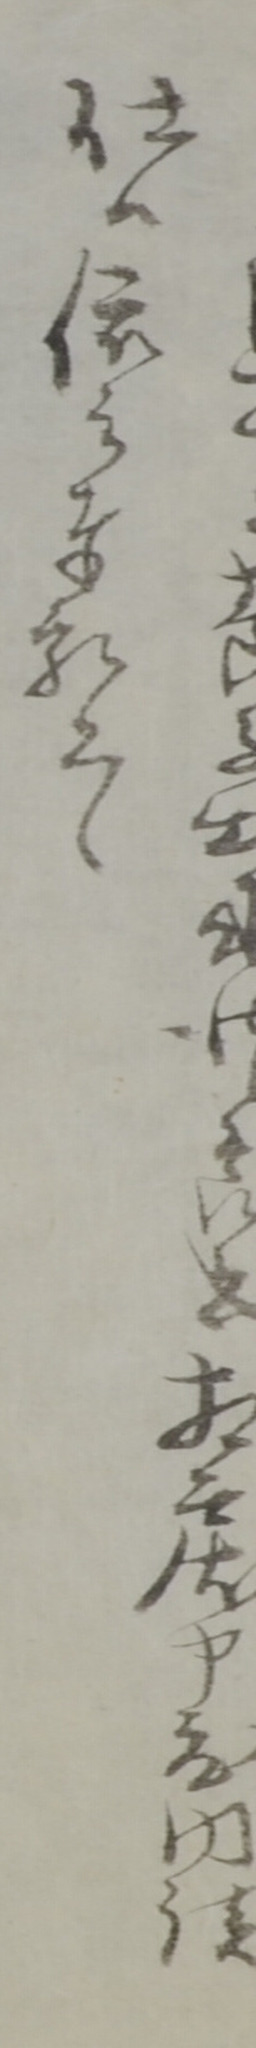仕候依之奉願上候
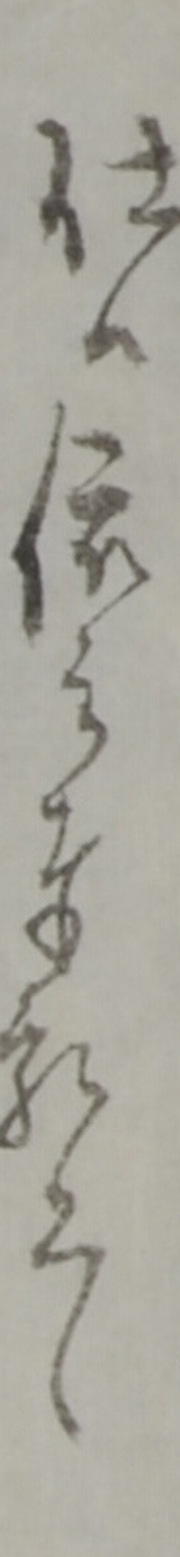仕候依之奉願上候
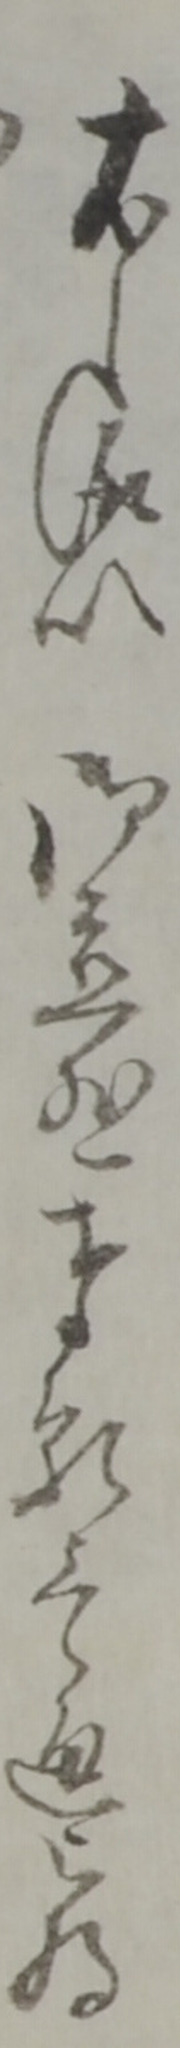右之趣以御慈悲奉願上候通被為仰付
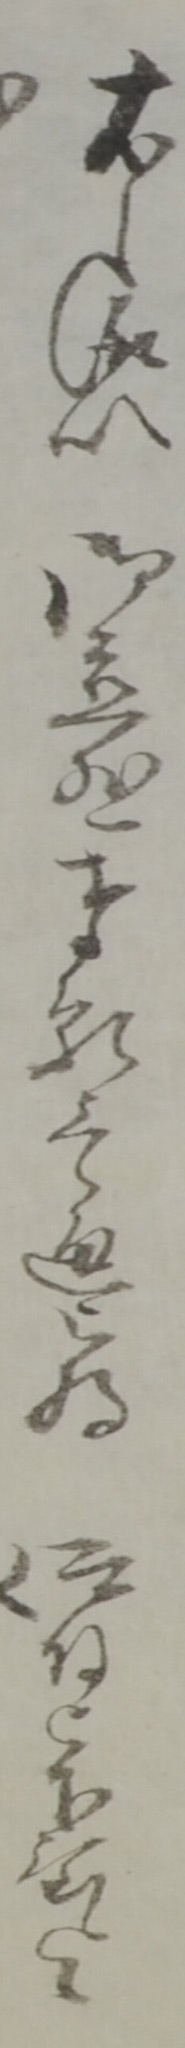右之趣以御慈悲奉願上候通被為仰付被下置候ハヽ
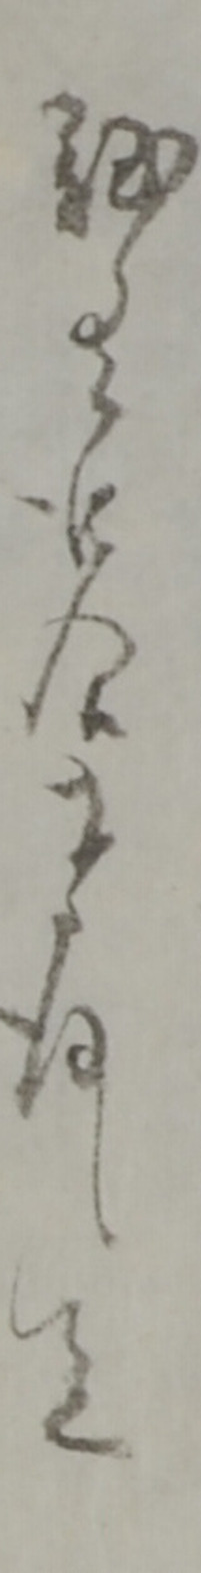難有仕合納存候以上
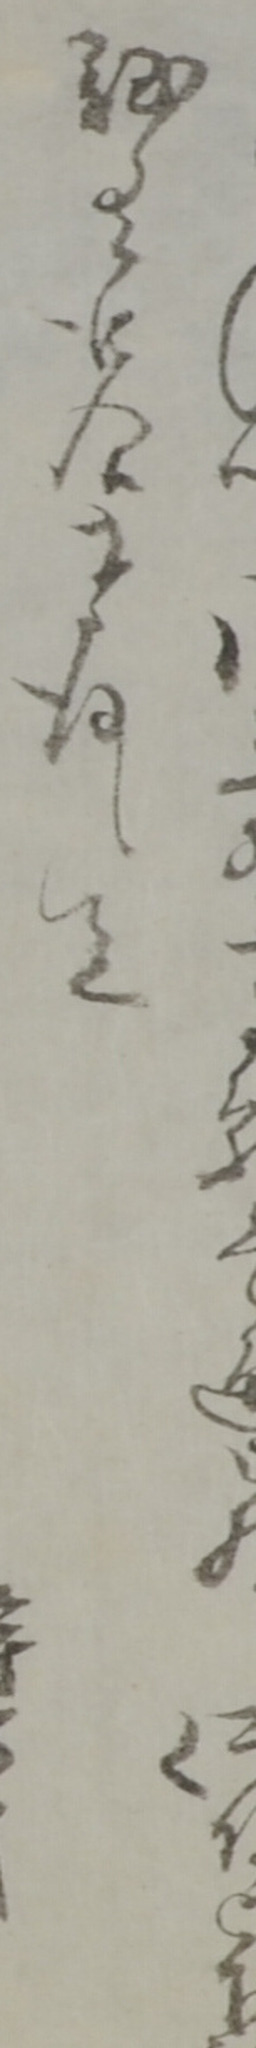難有仕合納存候以上
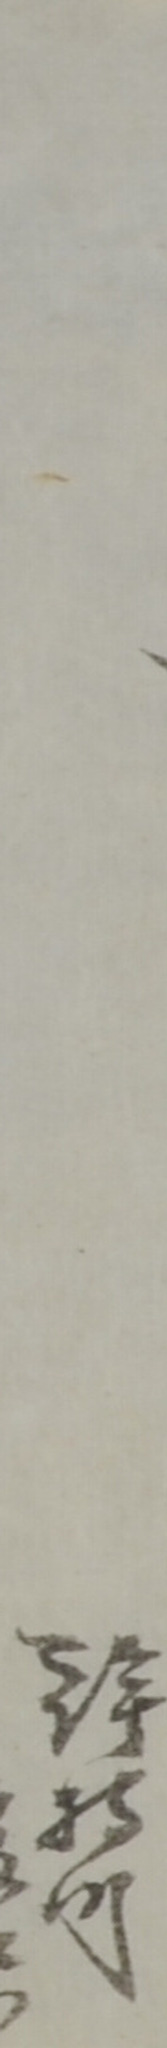鉾持町
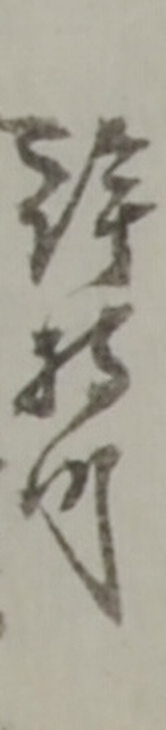鉾持町
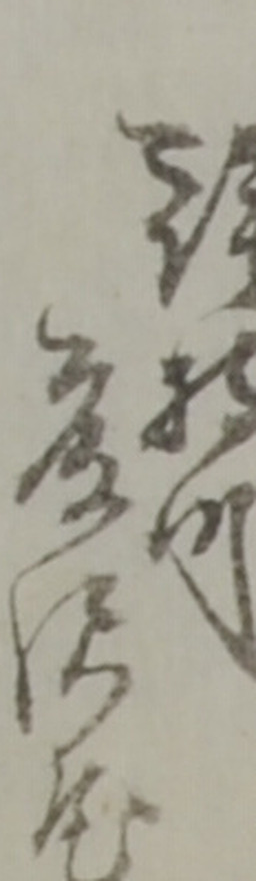藤沢屋
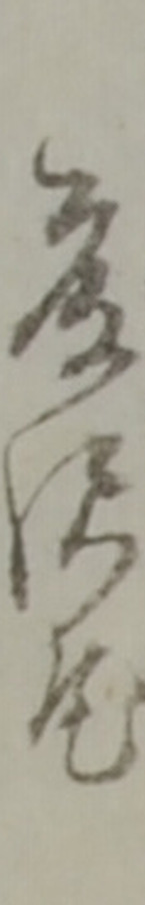藤沢屋
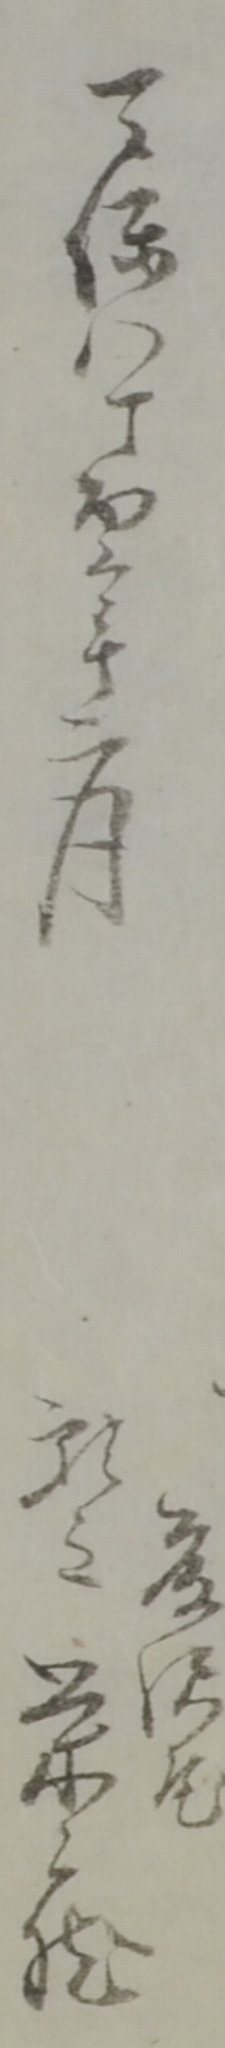天保八丁酉年二月願主栄蔵
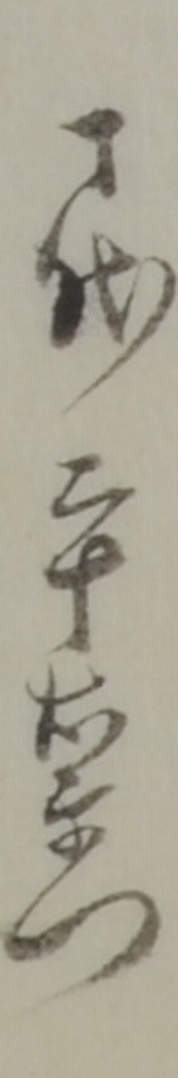町代平右衛門
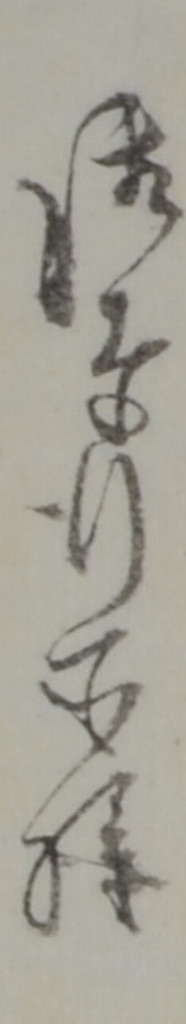御奉行所様
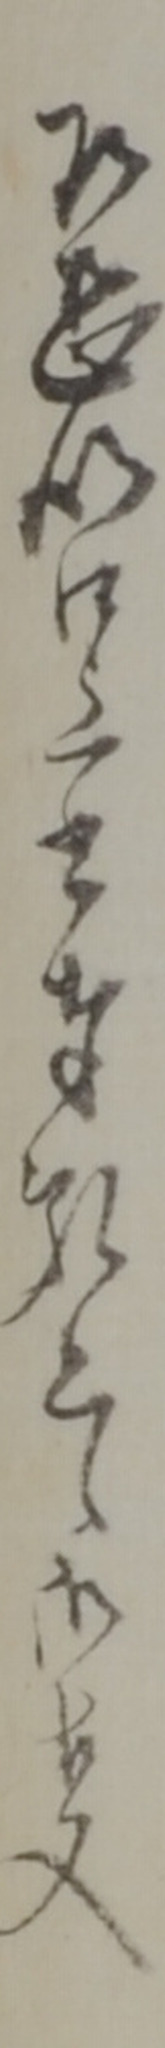乍恐以口上書奉願上候御事
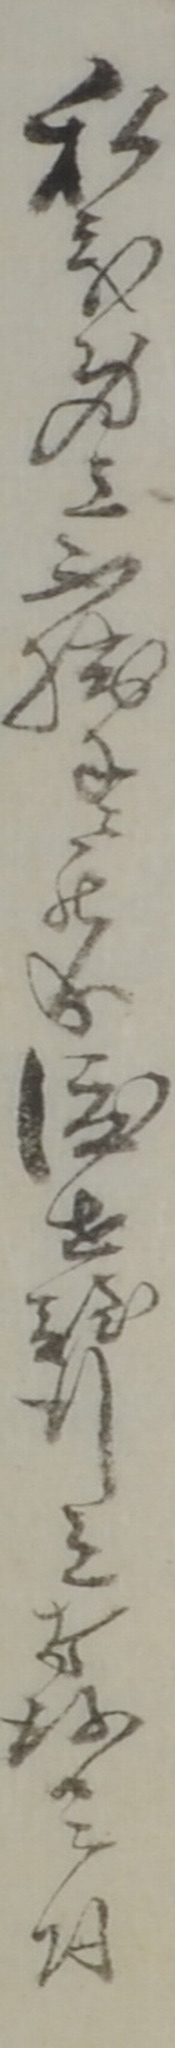私義身上不勝手ニ罷成渡世難行と奉存候ニ付
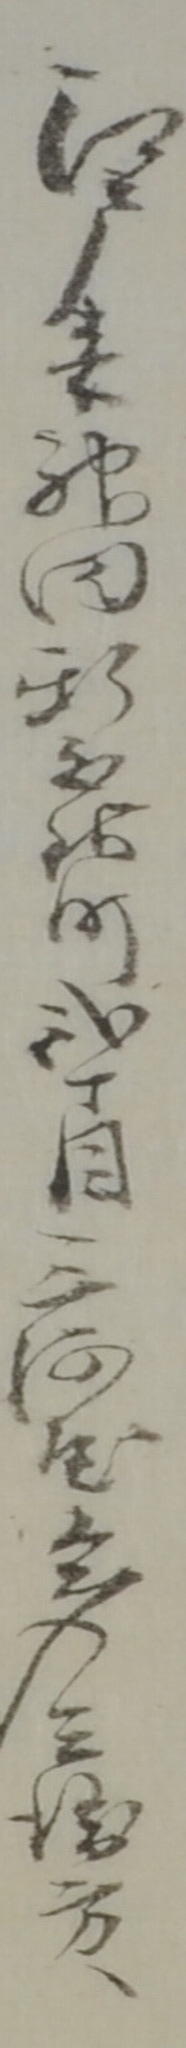江戸表神田新白銀町弐丁目三河屋多兵衛方へ
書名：諸願書控帳
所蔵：伊那市立高遠町図書館・合同会社AMANE
